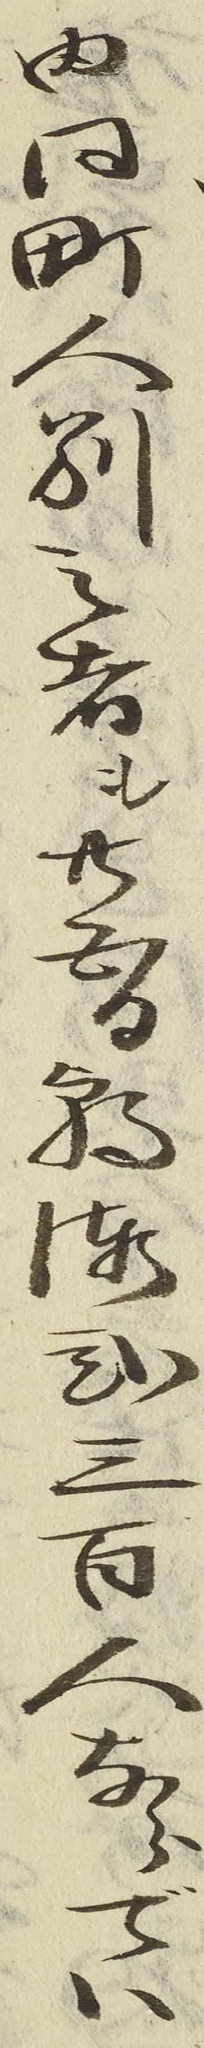由同町人別之者も廿五日朝漸弐三百人ならでハ
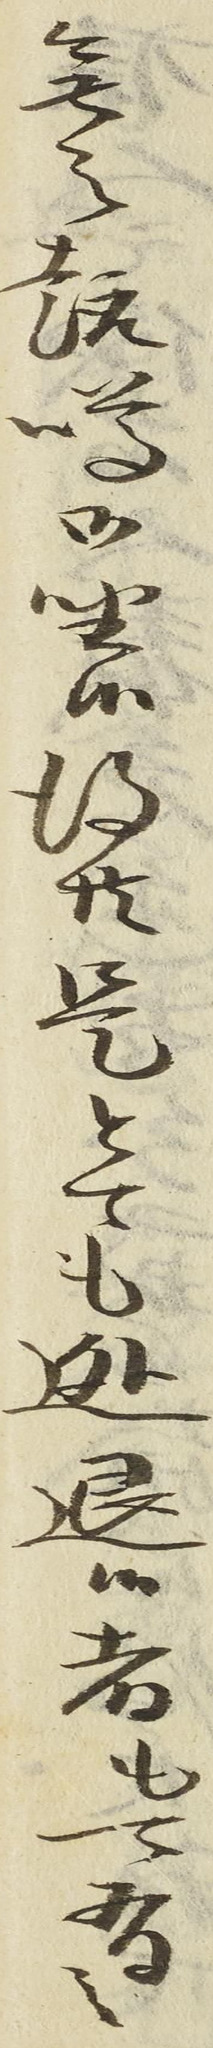無之趣噂御坐候得共是とても逃退候者も可有之
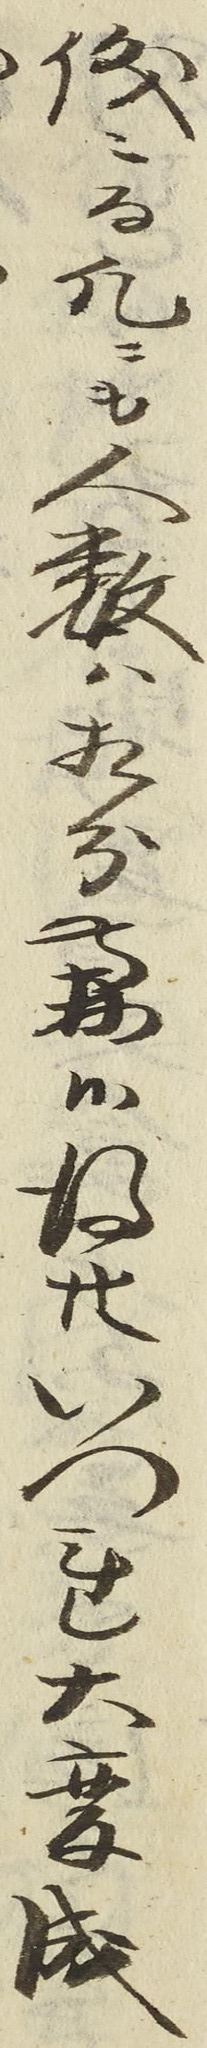儀二而凡二も人数ハ相分兼候得共いつれ大変成
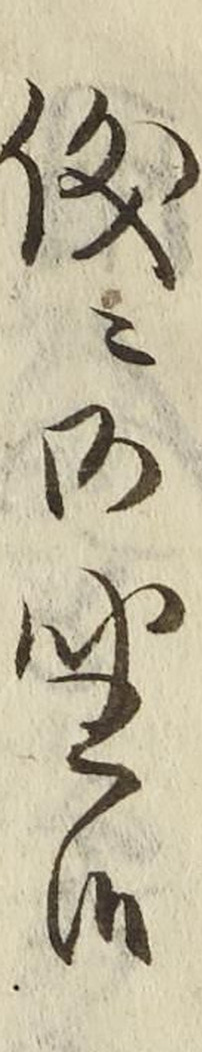儀二御坐候
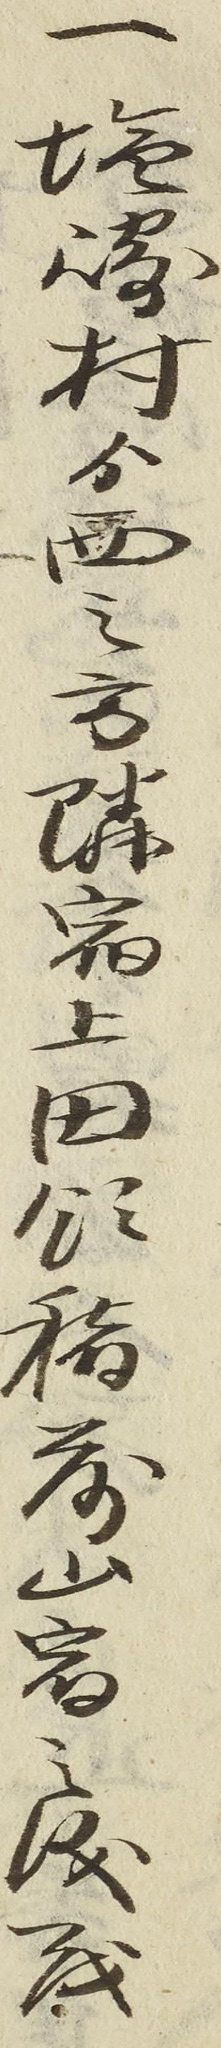一塩崎村ゟ西之方隣宿上田領稲荷山宿之儀も
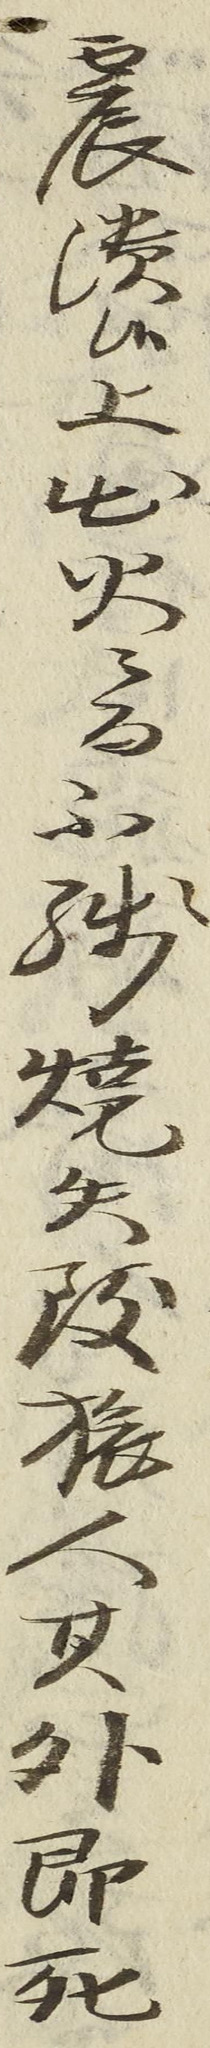震潰候上出火二而不残焼失致旅人其外即死
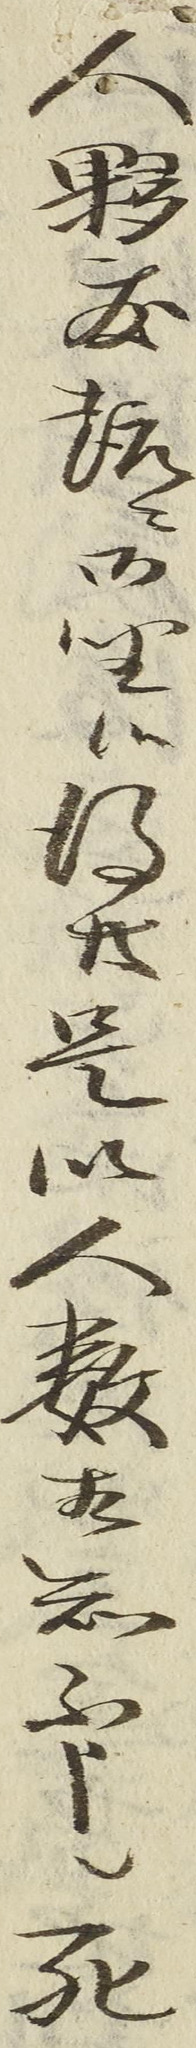人夥敷趣二御坐候得共是以人数相知不申候死
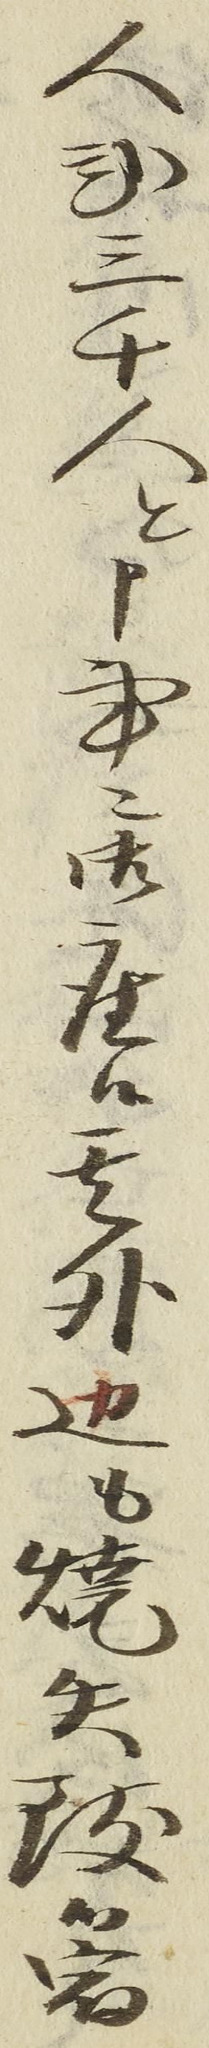人弐三千人と申事二御座候其外迚も焼失致候宿
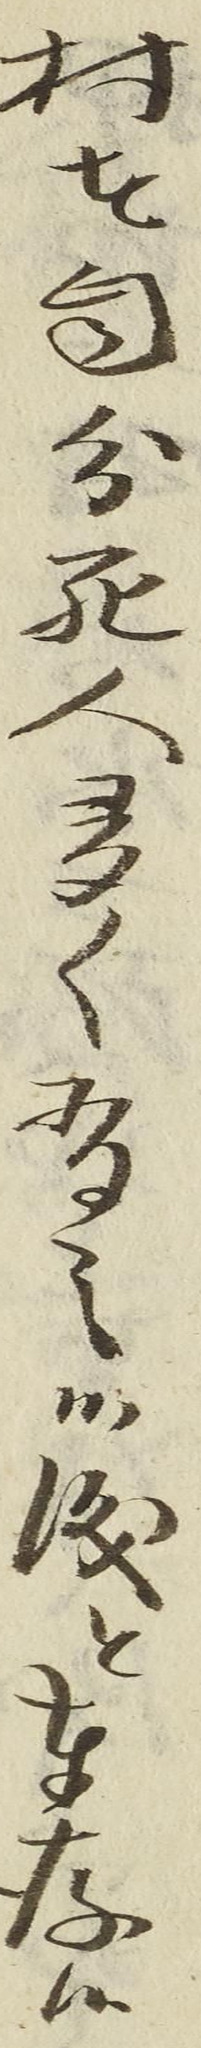村は何分死人多く有之候儀と奉存候
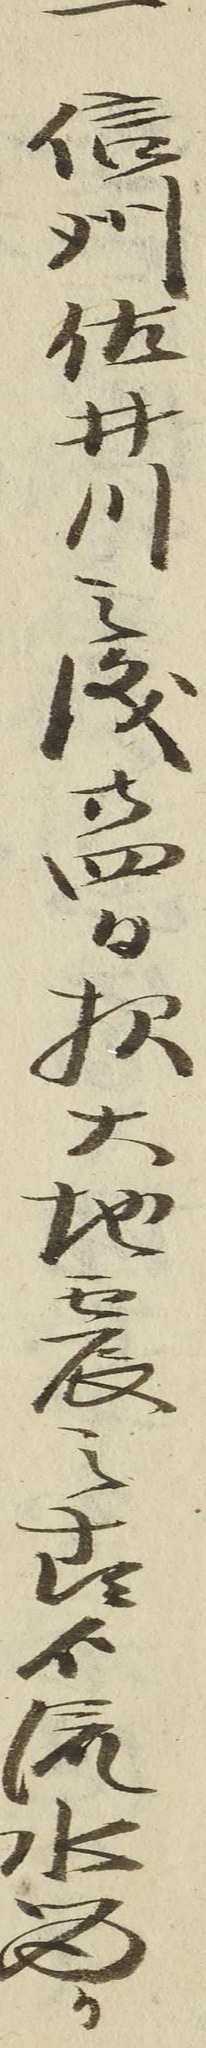一信州佐井川之儀廿四日夜大地震之節ゟ流水留り
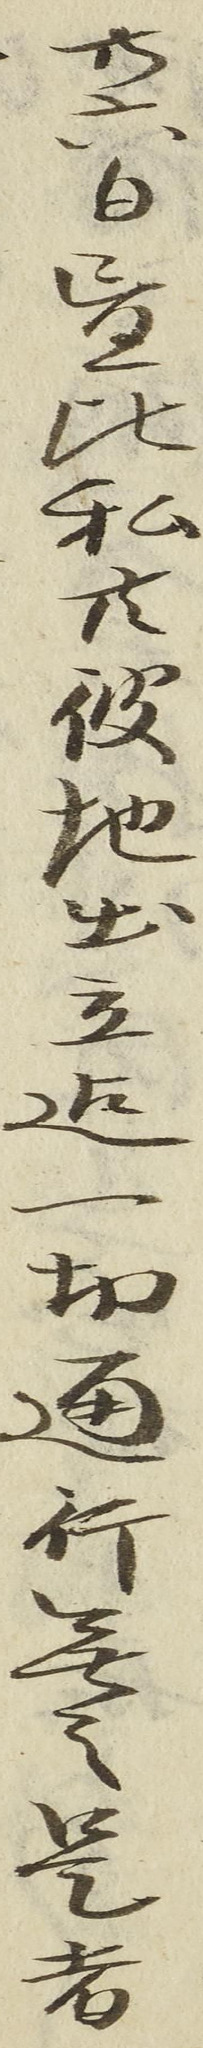廿六日昼比私共彼之地出立之迄一切通行無之是ハ
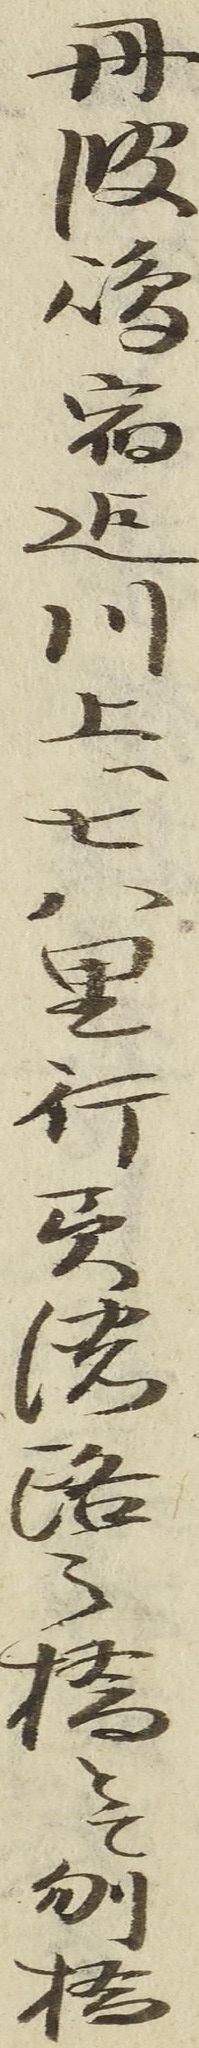丹波嶋宿迄ゟ川上ヘ七八里行美濃路之橋とて刎橋
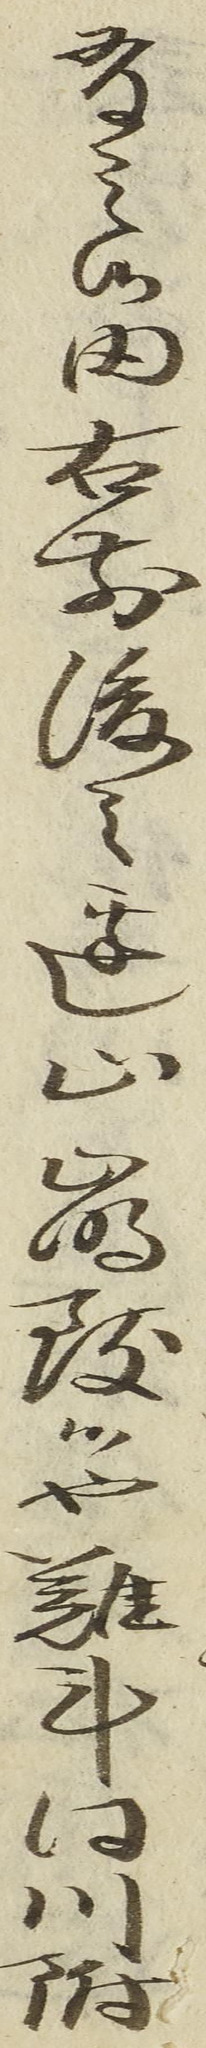有之候由右前後之辺山崩致候や難斗同川附ハ
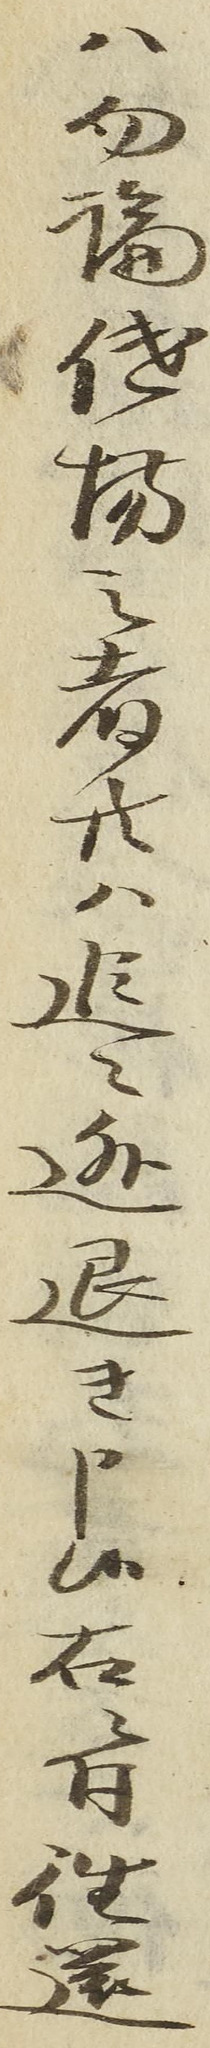ハ勿論低場之者共ハ追々逃退き申候右二付往還

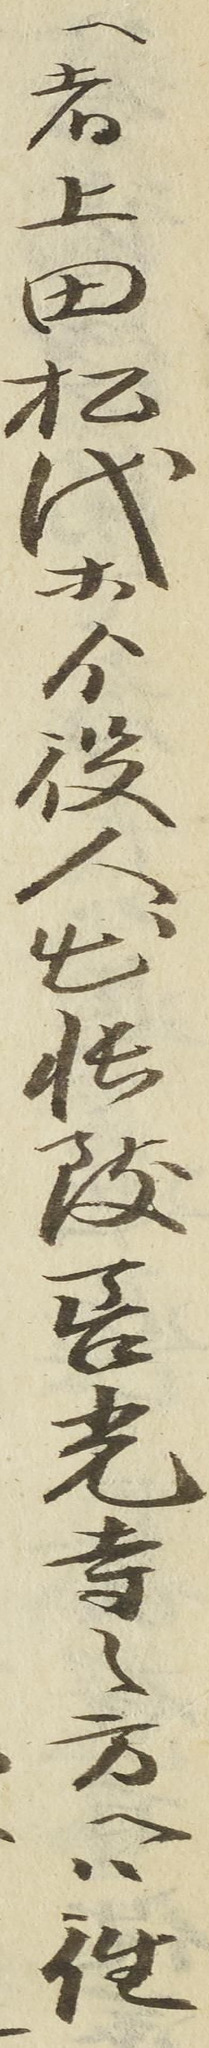へは上田松代等ゟ役人出張致善光寺之方へハ往
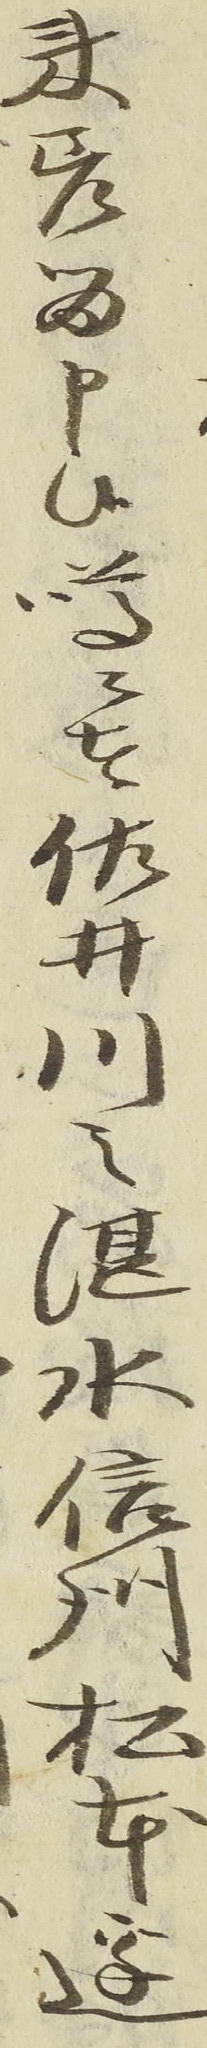來差留申候噂二は左井川之湛水信州松本辺
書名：信濃國大地震記　乾
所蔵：東京大学地震研究所図書室 Earthquake Research Institute Library, The University of Tokyo, JAPAN
